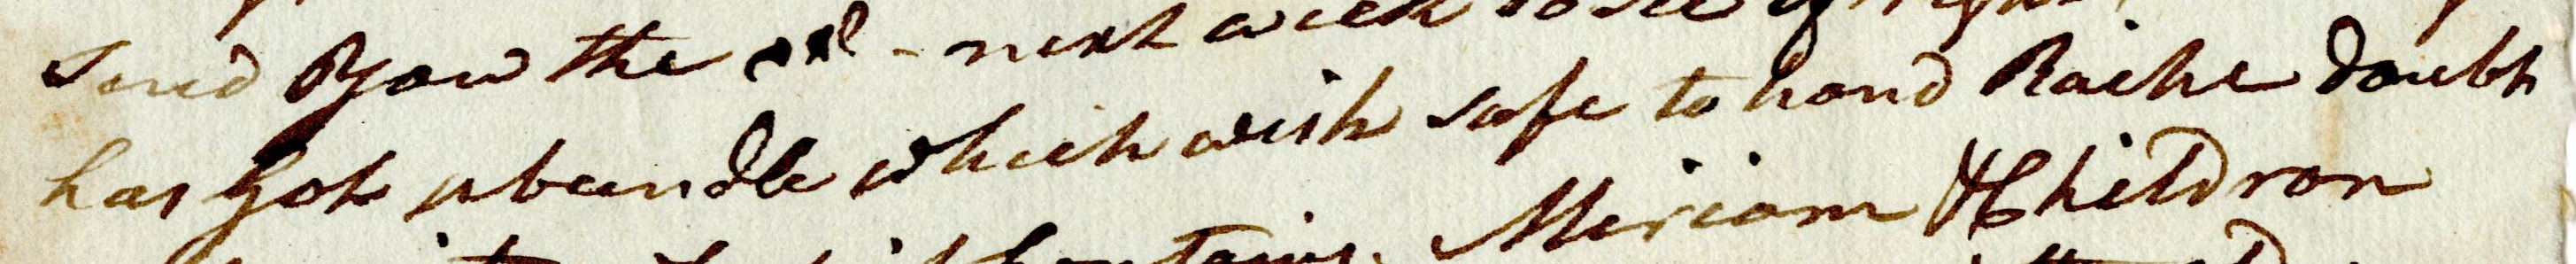has Got a bundle which wish safe to hand Rachl doubt
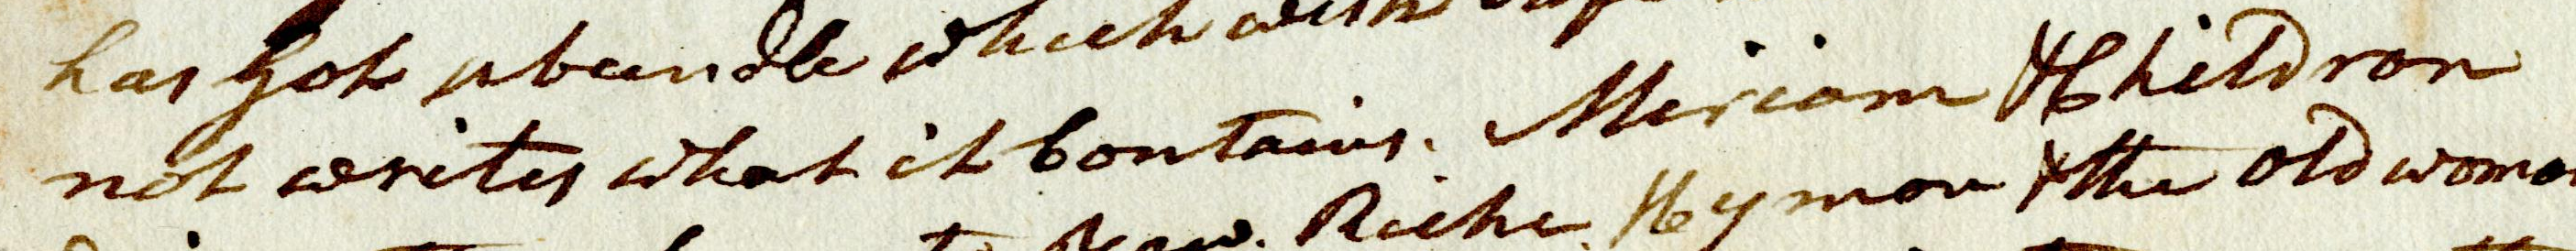not writes what it Contains. Miriam & Children
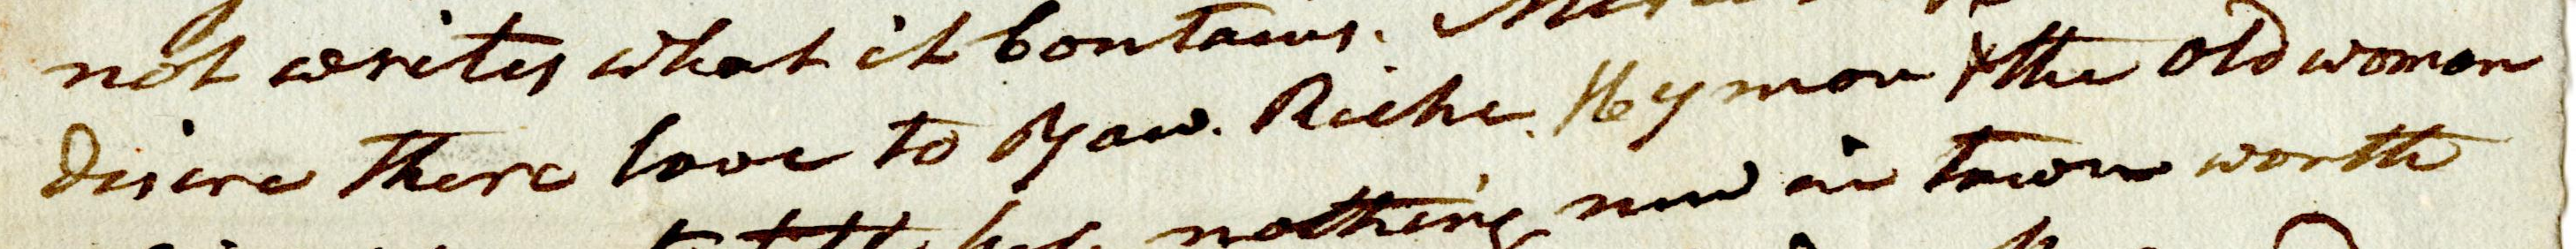desire there love to you. Rach^l Hymon & the old womon
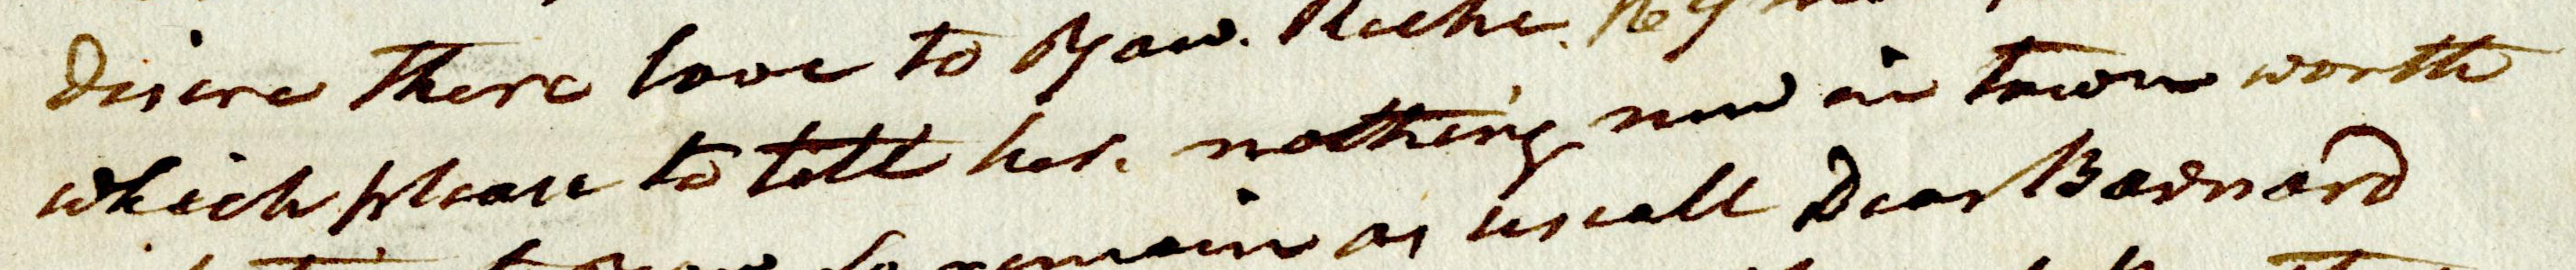which please to tell her. nothing new in town worth
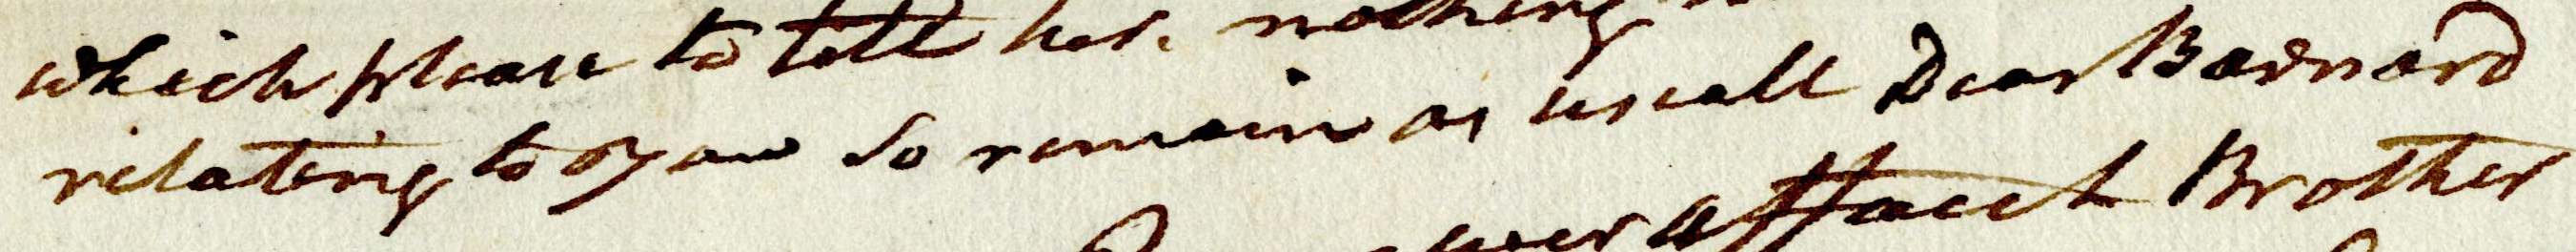relating to you so remain as usuall Dear Barnard
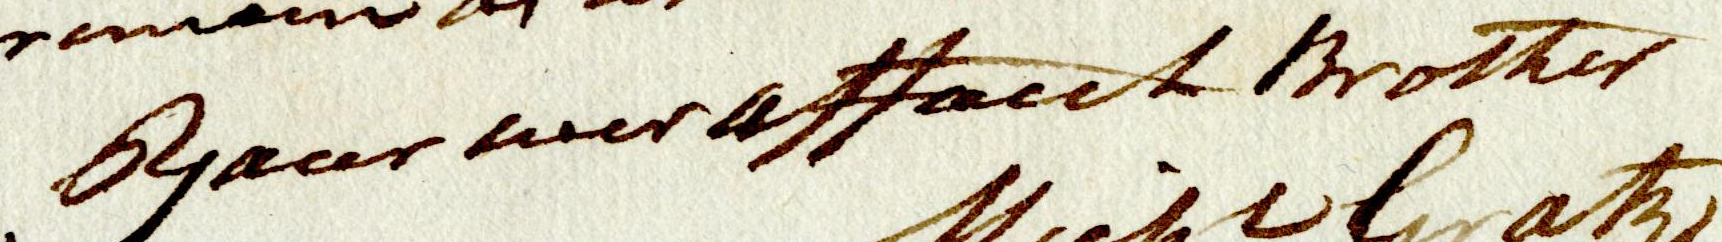your ever affect Brother
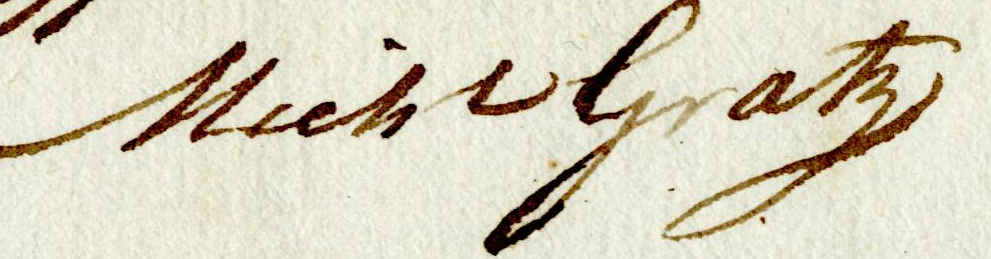Mich^l Gratz
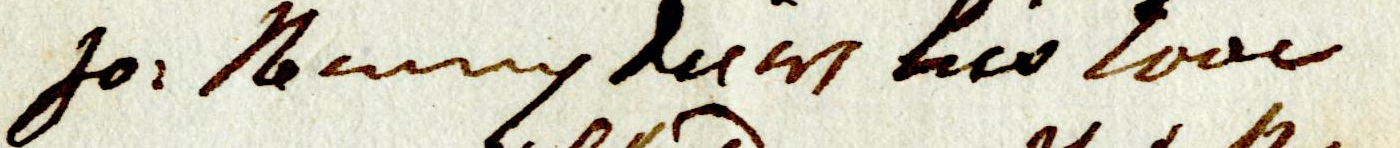So. Namny desires his love
